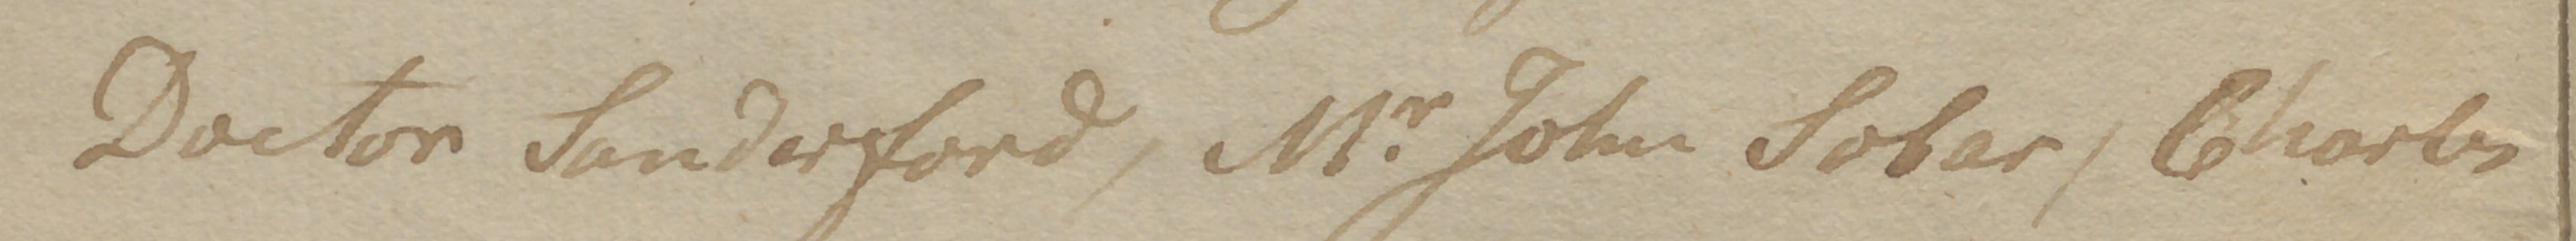Doctor Sanderford, M^r. John Sobar, Charles
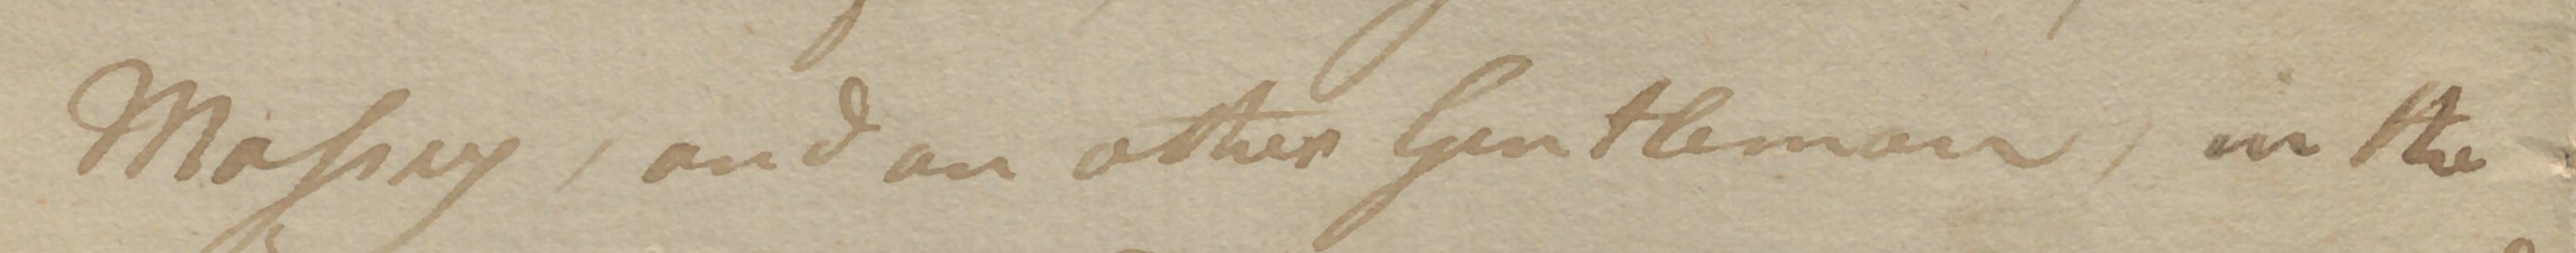Massey, and an other Gentlemen, in the
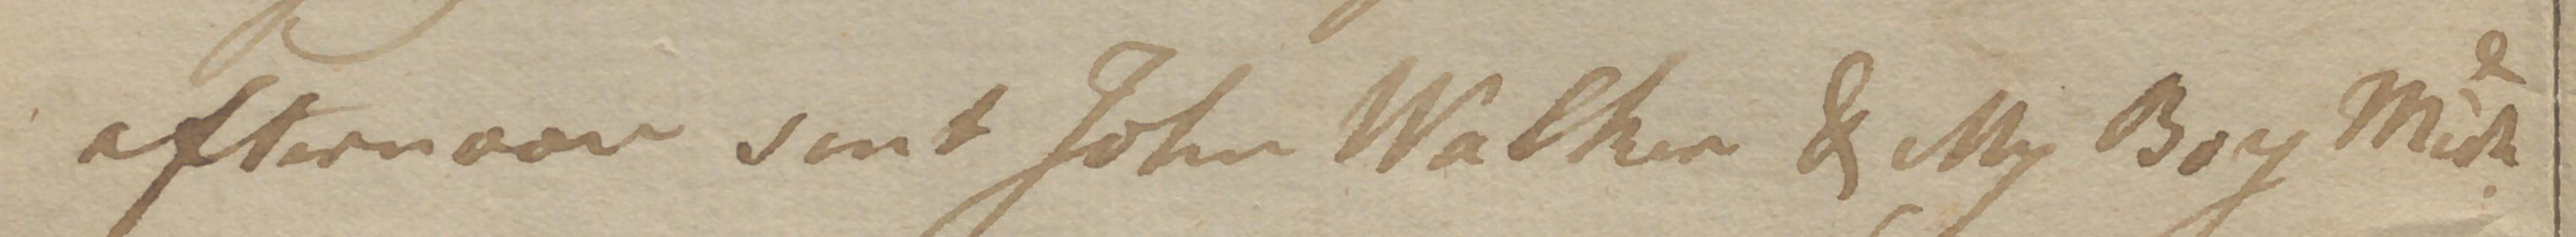afternoon sent John Walker & My Boy Mich^l
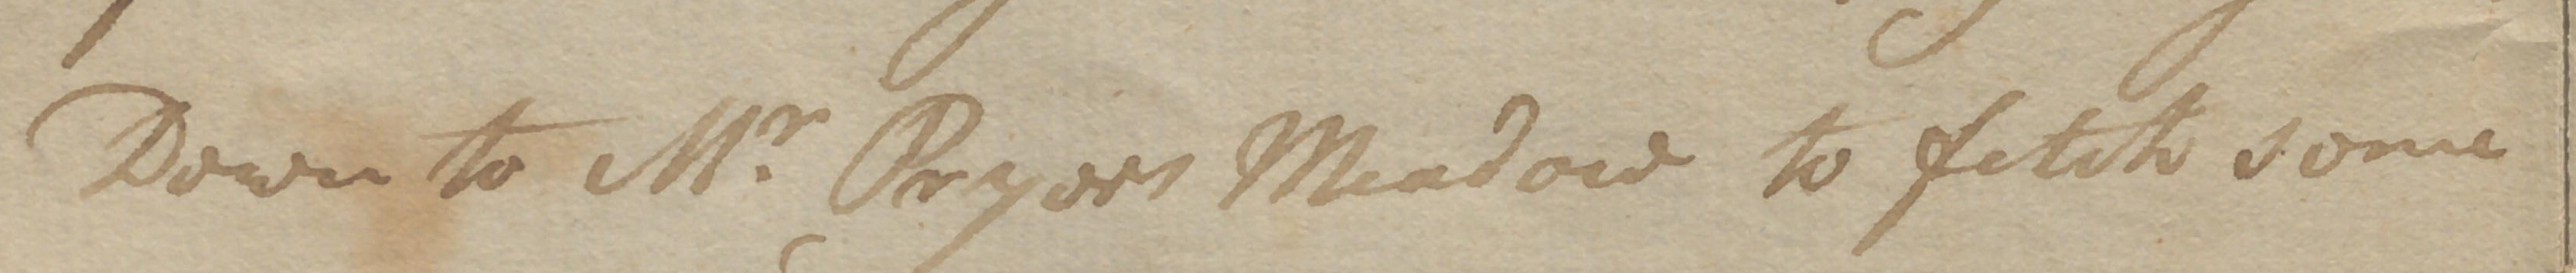Down to M^r. Pryors Meadow to fetch some
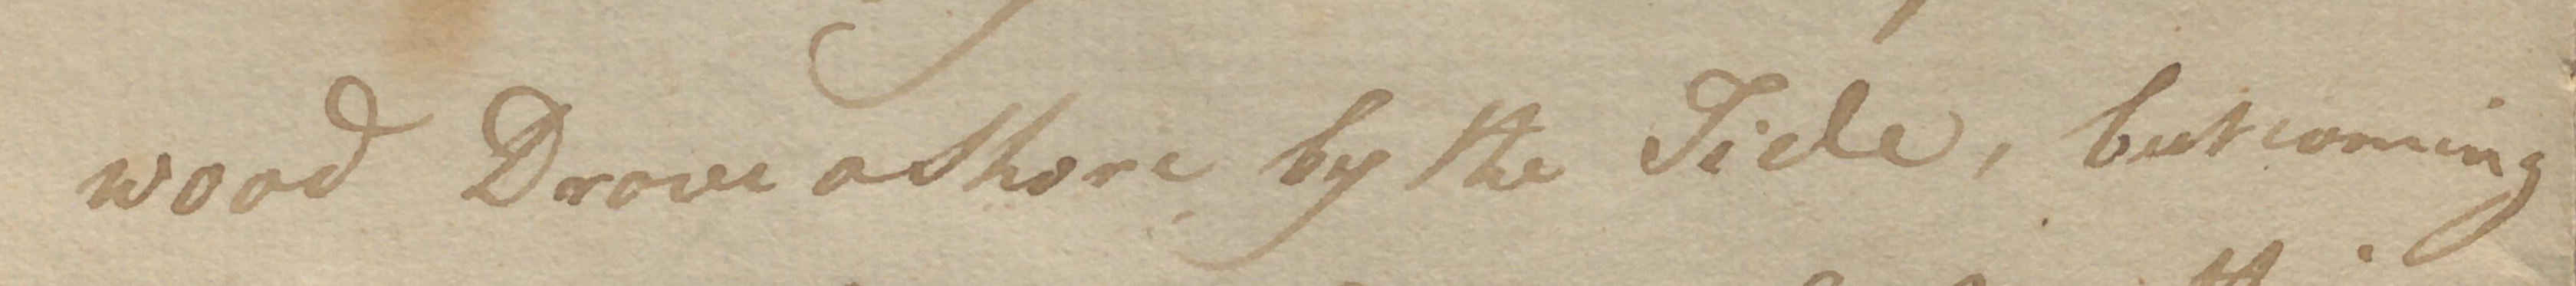wood Drove a shore by the Tide, but coming
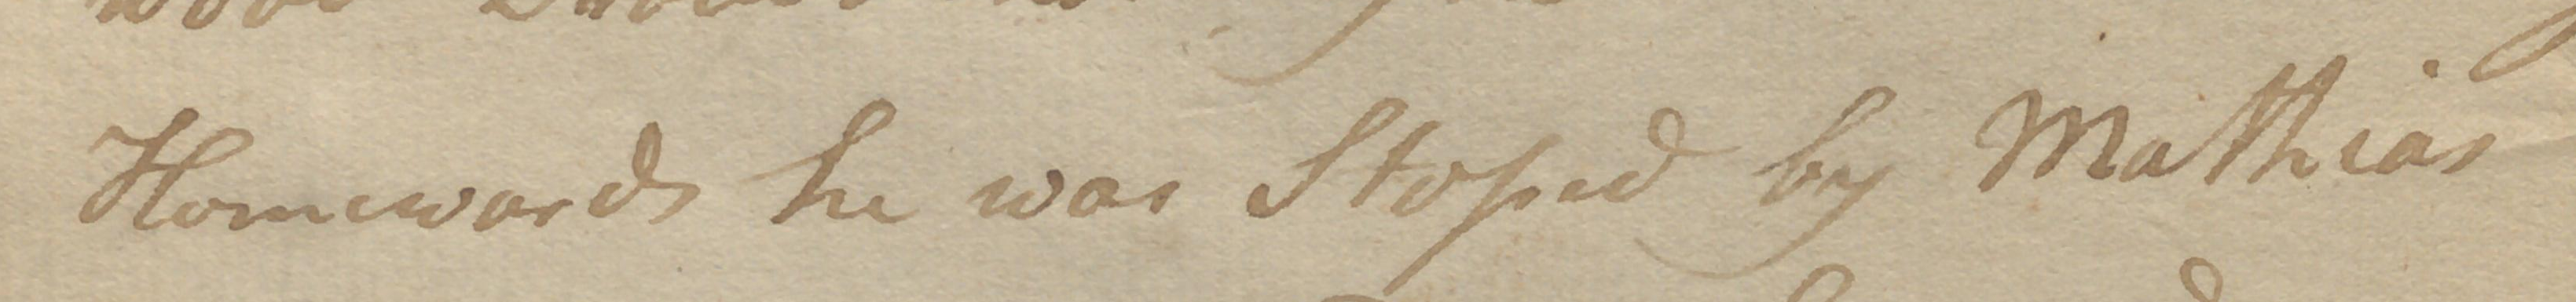Homewards he was Stoped by Mathias
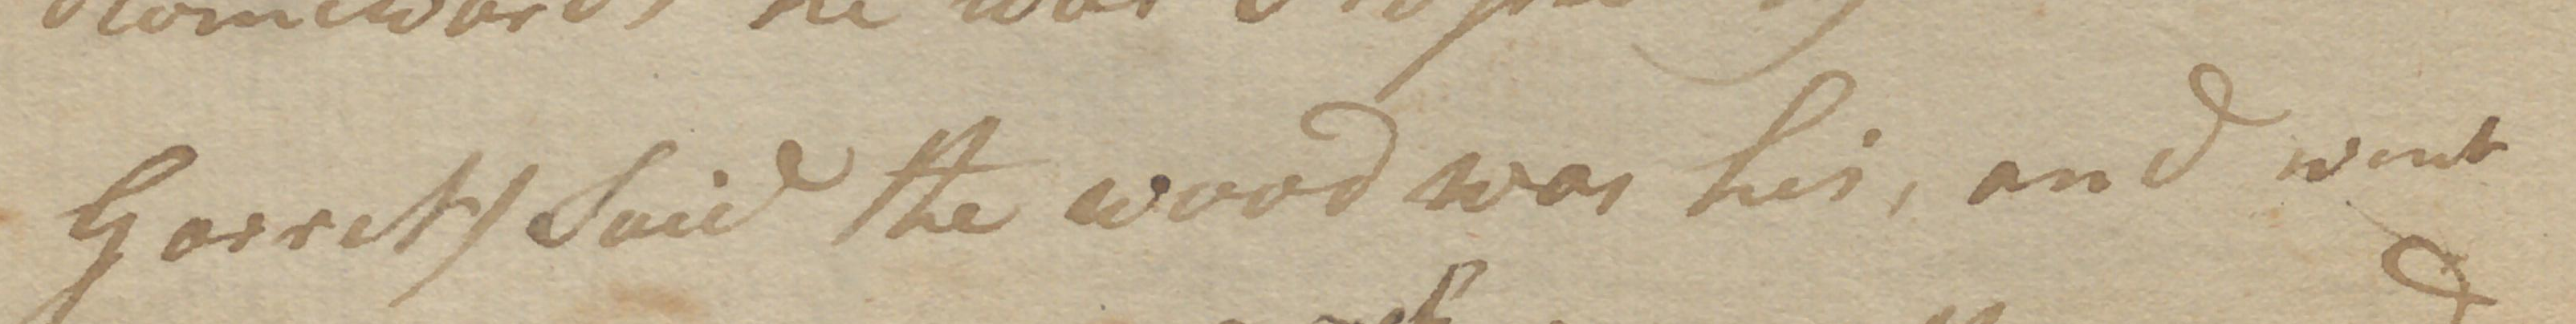Garret / Said the wood was his, and went
